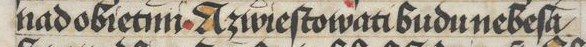nad obietmi.A zwieſtowati budu nebeſa
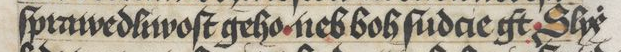ſprawedliwoſt geho.neb boh ſudcie ḡt.Slyṡ
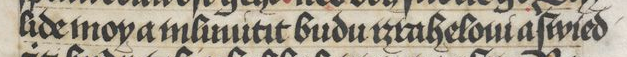lide moy a mluuitit budu izraheloui a ſwied¬
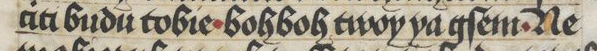ċiti budu tobie.boh boh twoy ya gſem.Ne
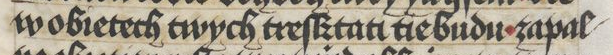w obietech twych treſktati tiebudu.zapal¬
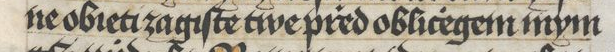ne obieti zagiſte twe před obliċegem mym
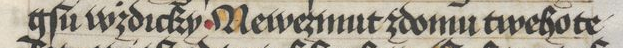gſu wždicky.Newezmut zdomu tweho te¬
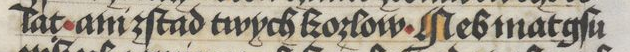lat.ani zſtad twych kozlow.Neb mat gſu
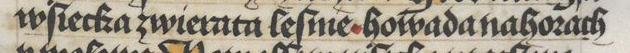wẛiecka zwierata leſníe.howada nahorach
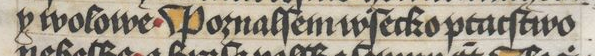y wolowe.Poznalſem wẛecko ptacſtwo
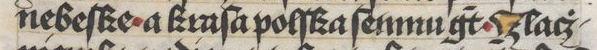nebeſke.a kraſa polſka ſemmu ḡt.Zlacż¬
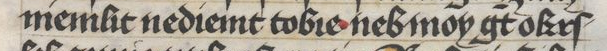níemlit nedíemt tobie.neb moy ḡt okrſ¬
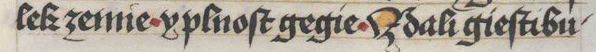lek zemie.y plnoſt gegíe.Zdali gieſtibu¬
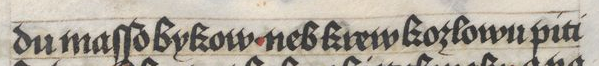du maſſo bykow.neb krew kozlowu píti
